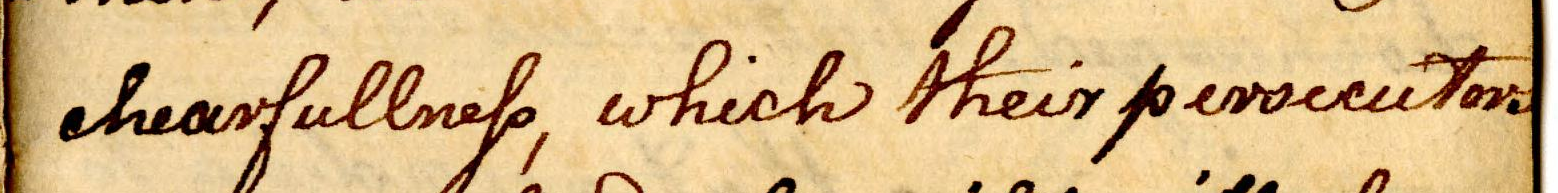chearfullness, which their persecutors
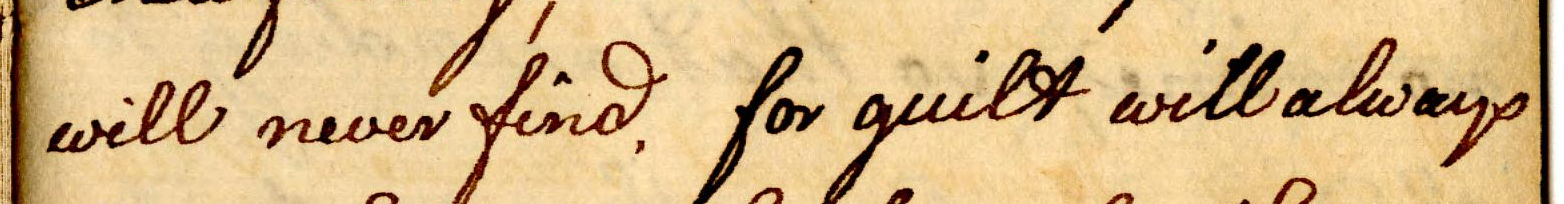will never find, for guilt will always
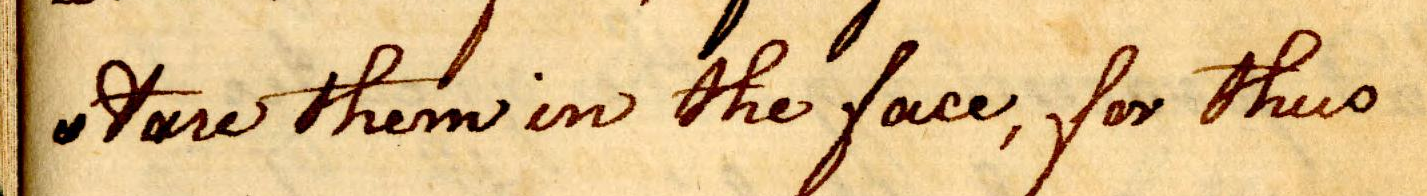stare them in the face, for thus
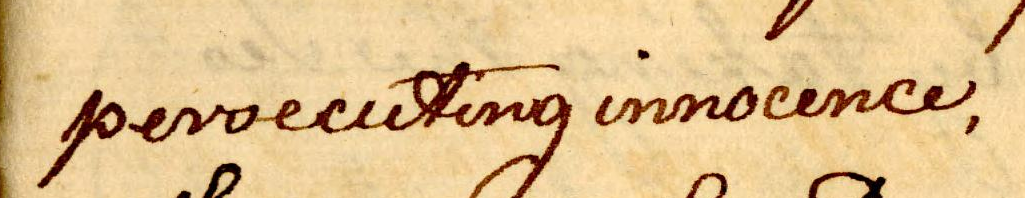persecuting innocence,
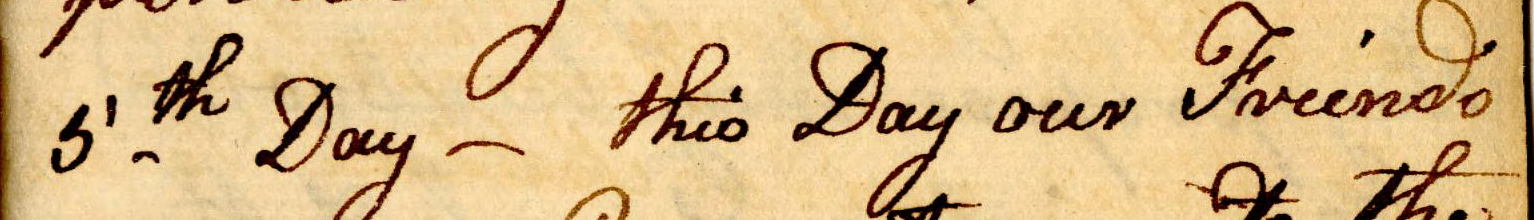5^th Day- this Day our Friends
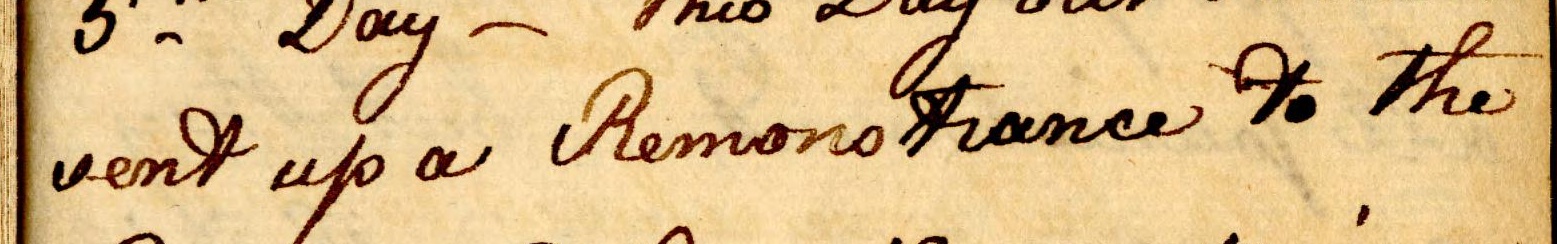sent up to a Remonstrance to the
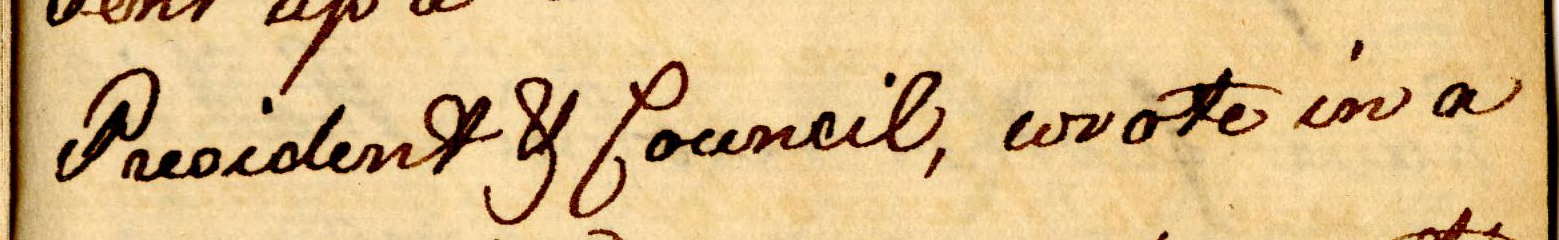President & Council, wrote in a
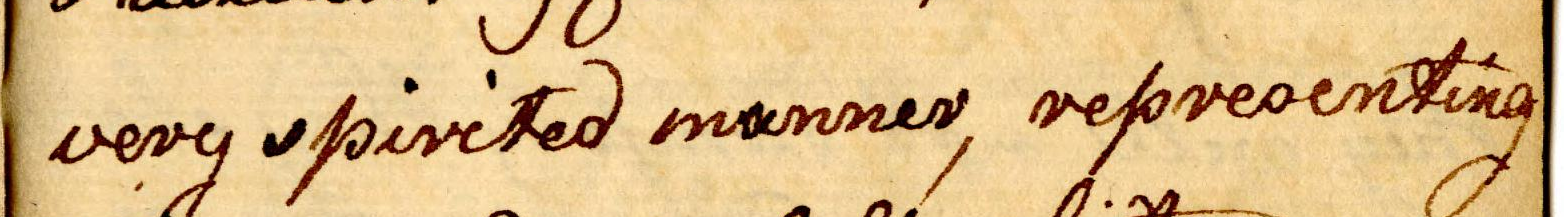very spirited manner, representing
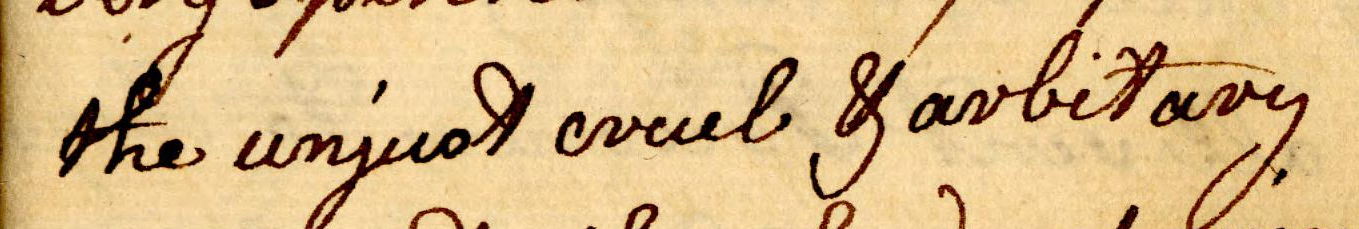the unjust cruel & arbitrary
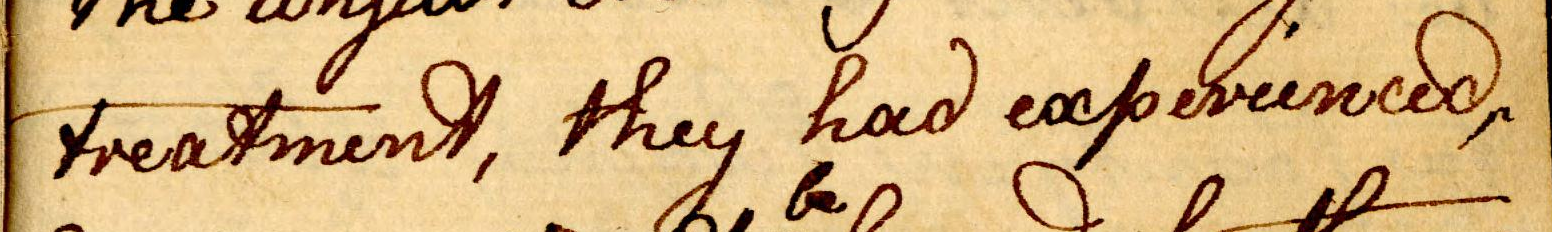treatment, they had experienced,
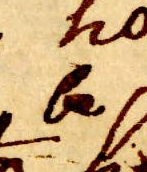be
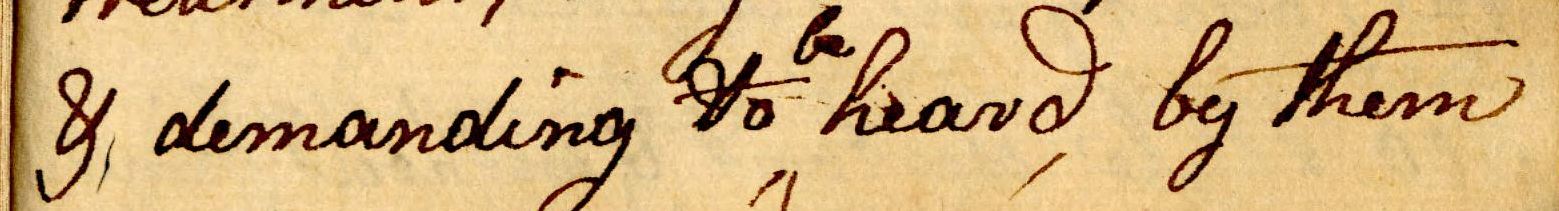& demanding to ^ heard by them
